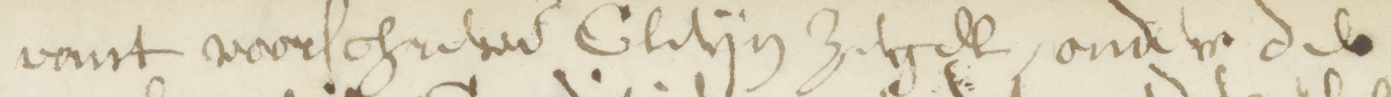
vant voorschreve Cleijn Zegel, onder de
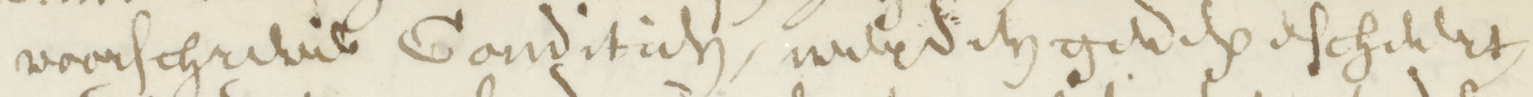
voorschreve Conditien, werden gedepescheert
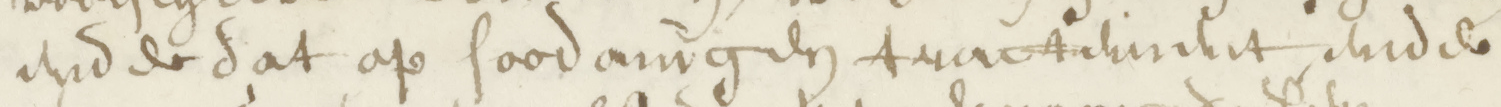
ende dat op soodanigen tractement ende
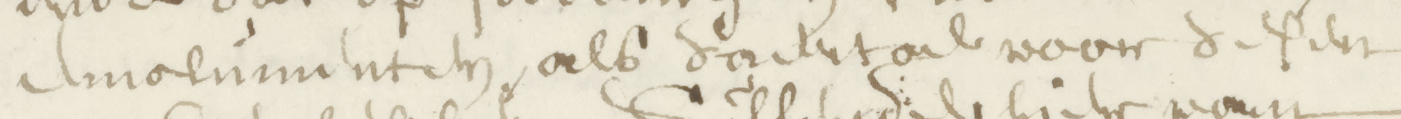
Emolumenten, als daertoe voor desen
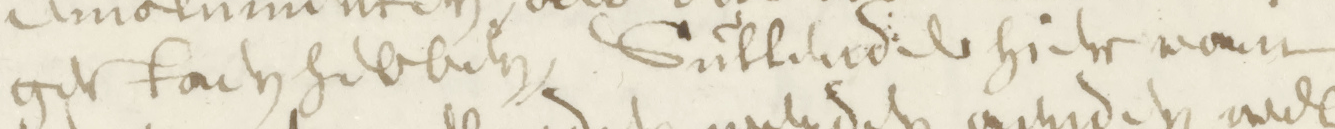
gestaen hebben. Sullende hier van
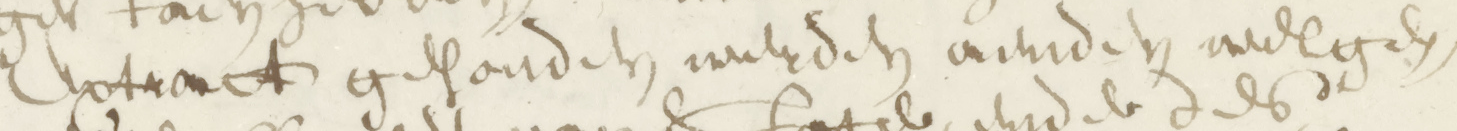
Extract gesonden werden aenden welge„
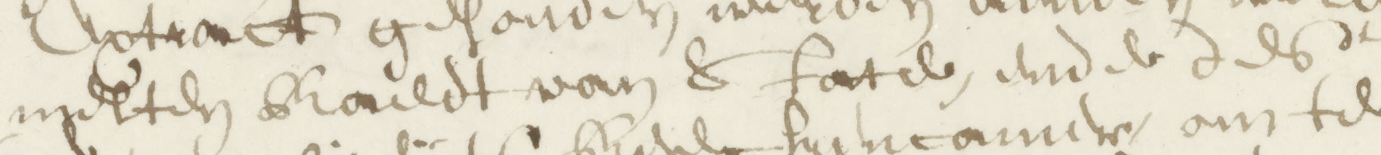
melten Raedt van State, ende des
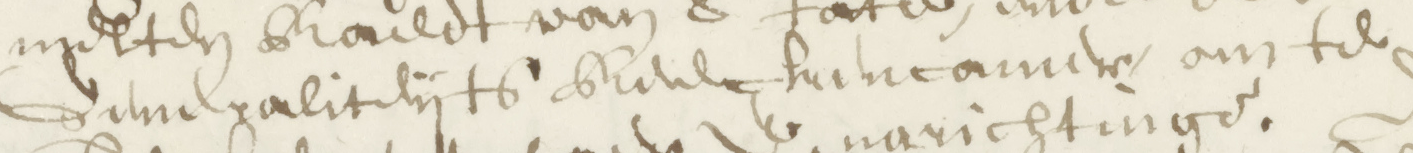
Generaliteijts Reeckencamer, om te
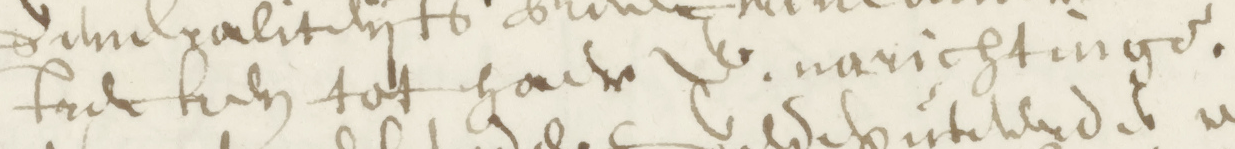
strecken tot haer E. narichtinge. De
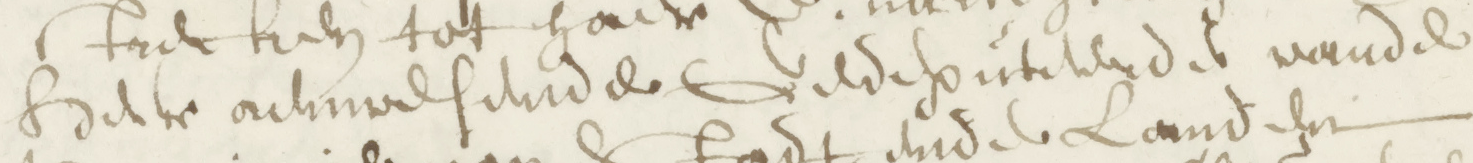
Heer aenwesende Gedeputeerde vande
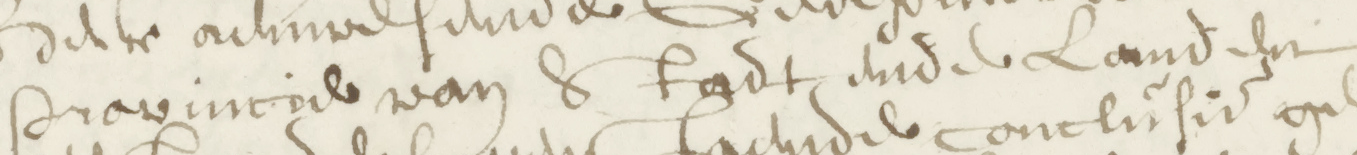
Provincie van Stadt ende Landen
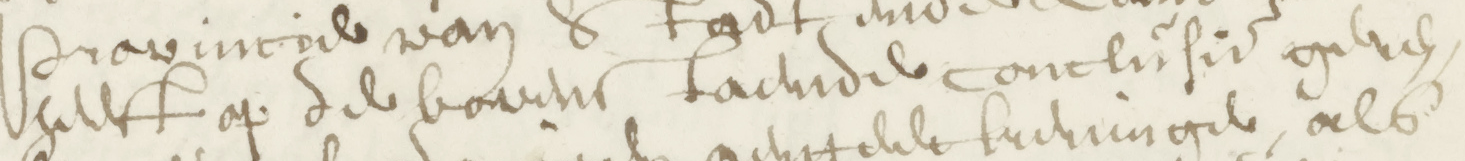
heeft op de bovenstaende conclusie gere„
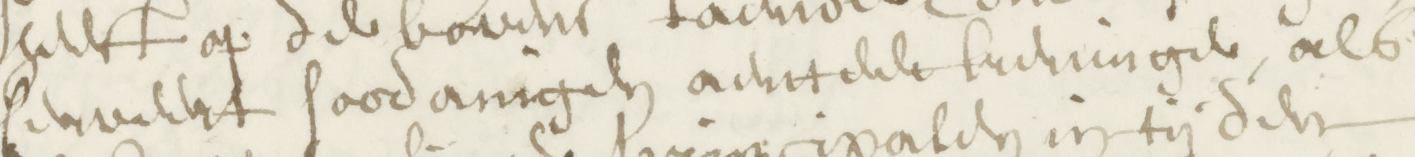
serveert soodanigen aenteeckeninge, als
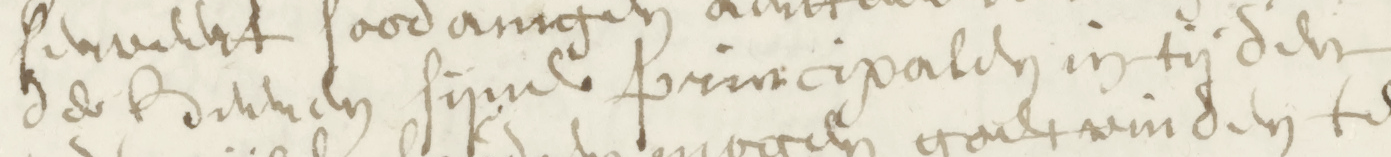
de Heeren sijne principalen in tijden
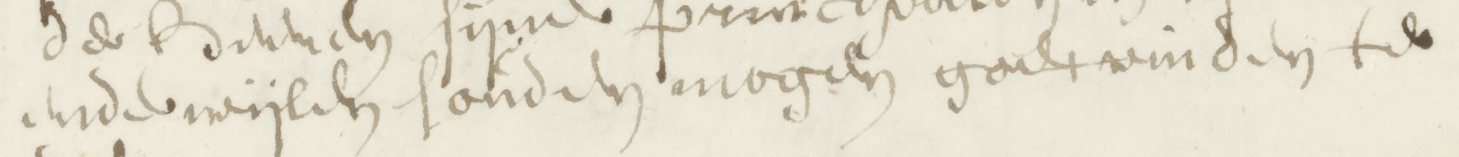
ende wijlen souden mogen goetvinden te
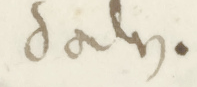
doen.
